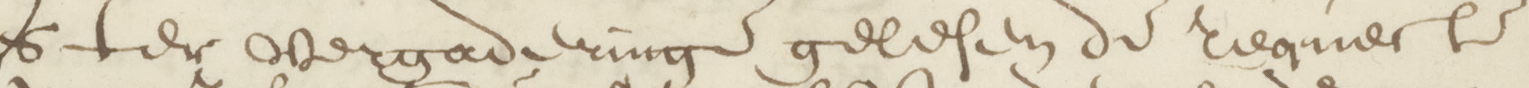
Is ter Vergaderinge gelesen de requeste
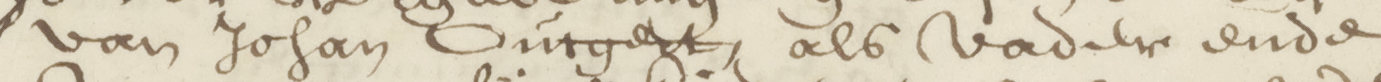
van Johan Outgert, als vader ende
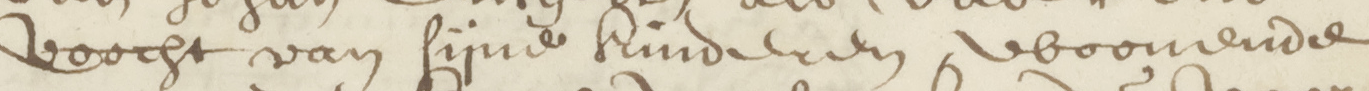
voocht van sijne kinderen, woonende
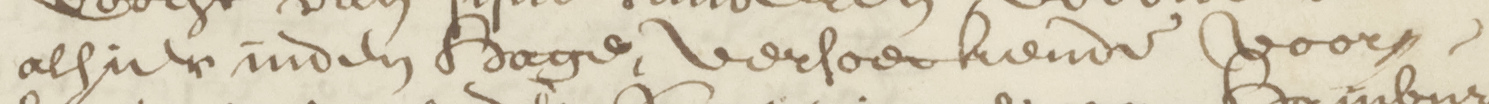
alhier inden Hage, versoeckende voor„
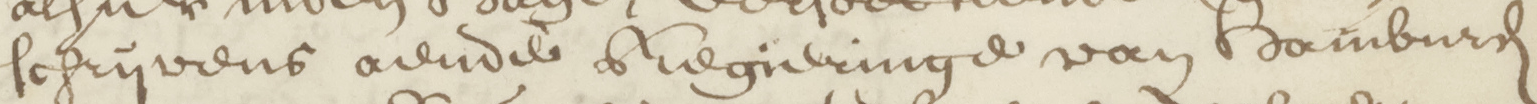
schrijvens aende Regieringe van Hamburch
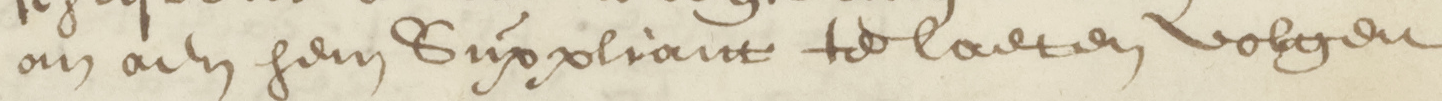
om aen hem Suppliant te laeten volgen
